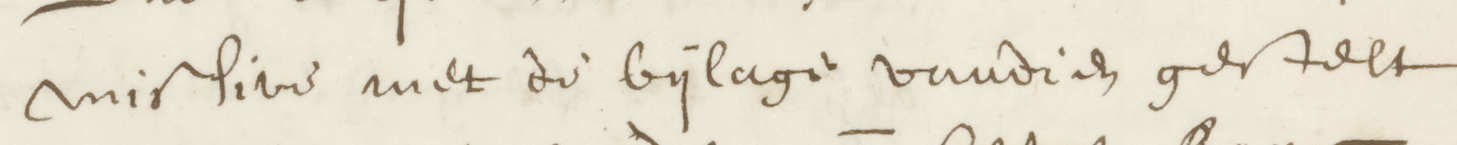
missive met de bijlage vandien gestelt
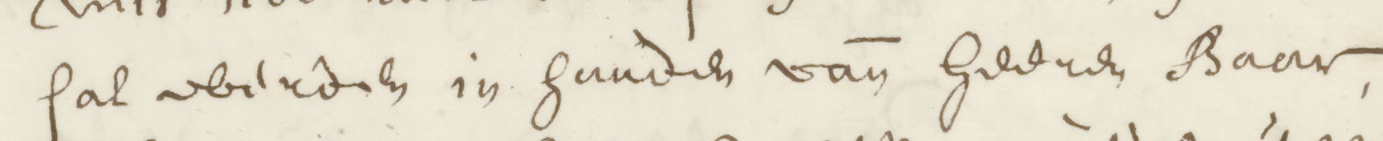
sal werden in handen van heeren Baar,
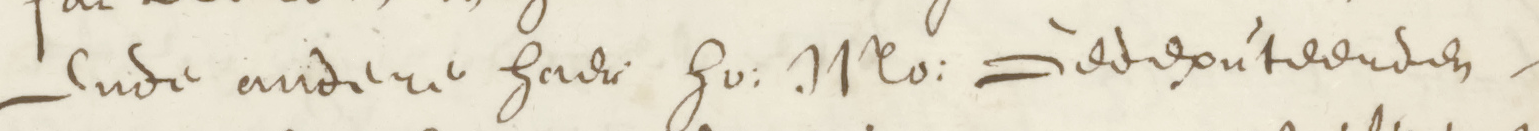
ende andere haer ho:Mo: Gedeputeerden
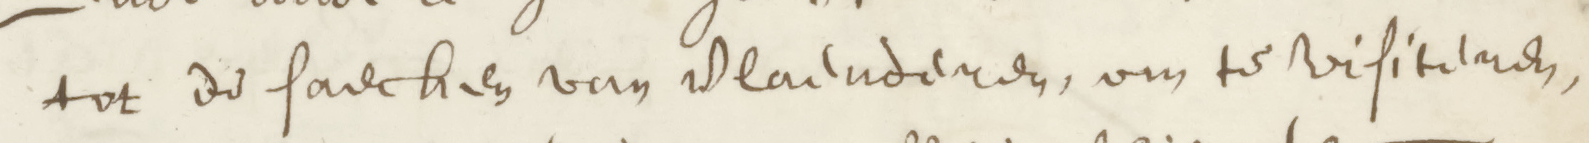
tot de saecken van Vlaenderen, om te visiteren,
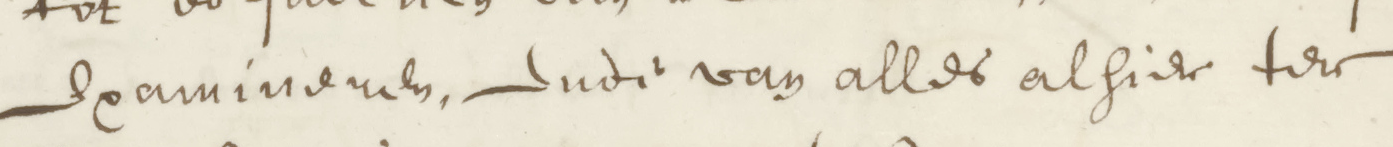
examineren, Ende van alles alhier ter
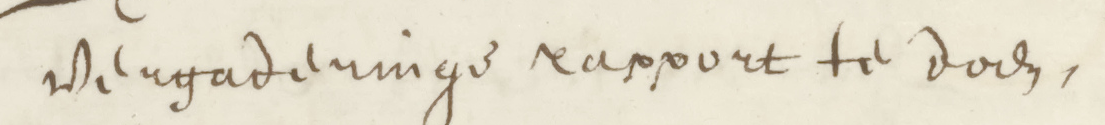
Vergaderinge rapport te doen.
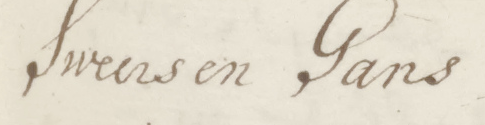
Sweers en Gans
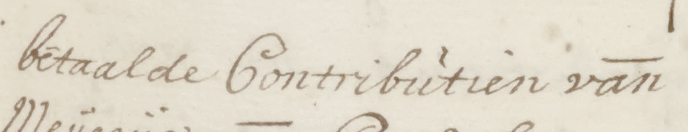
betaalde Contributien van
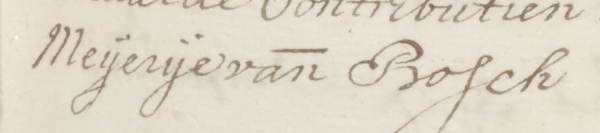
Meijerije van Bosch
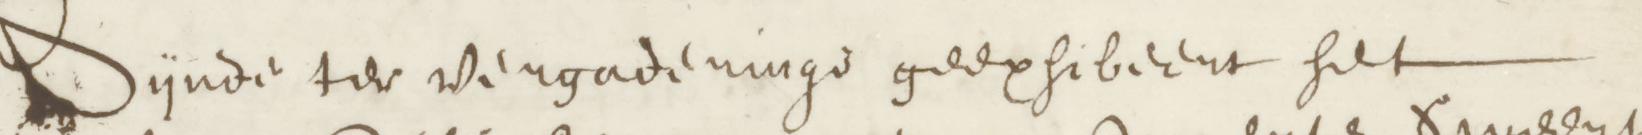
Sijnde ter Vergaderinge geexhibeert het
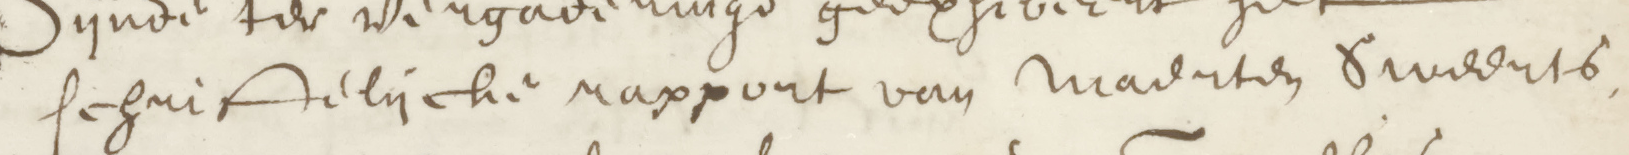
schriftelijcke rapport van maerten Sweerts,
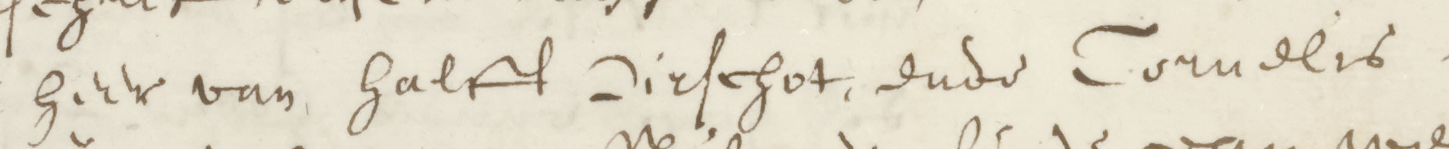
heer van halff Oirschot, ende Cornelis
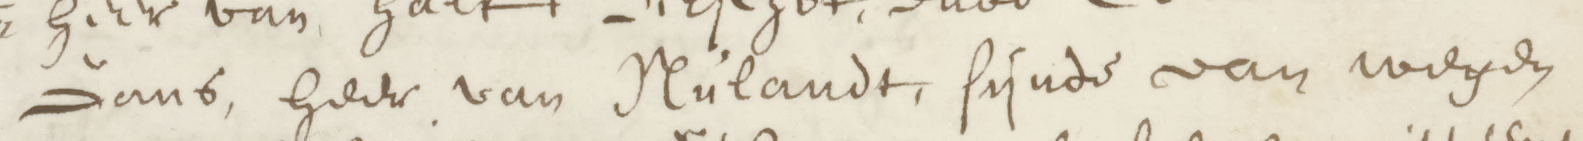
Gans, heer van Nulandt, sijnde van wegen
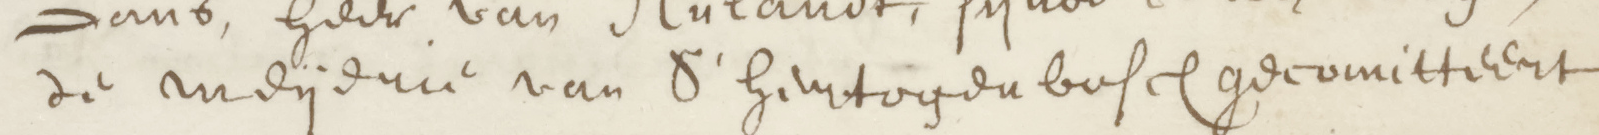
de meijerie van S'hertogenbosch gecomitteert
